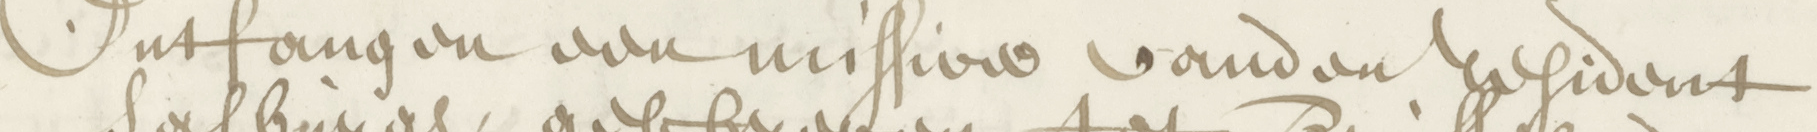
Ontfangen een missive vanden Resident
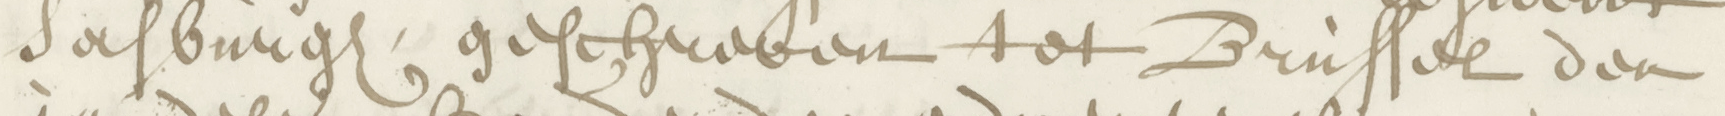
Sasburgh, geschreven tot Brussel den
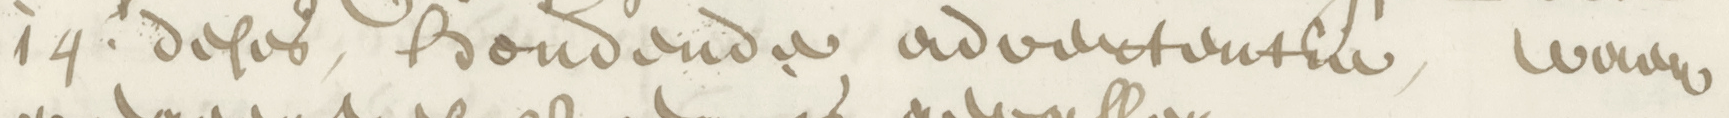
14. deses, houdende advertentie, Waer
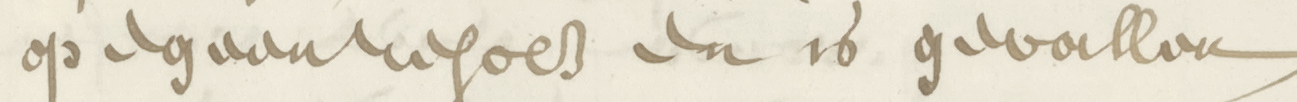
op egeen resol en is gevallen
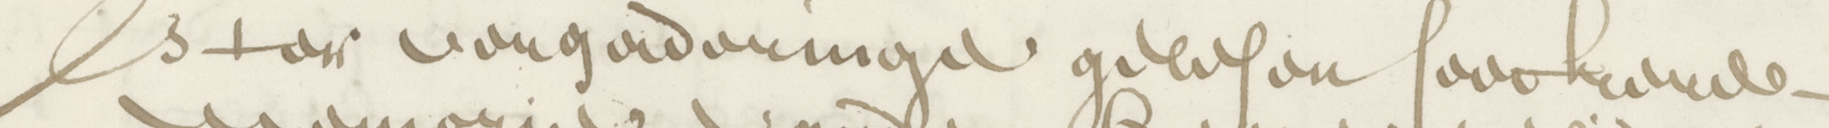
Is ter vergaderinge gelesen seeckere
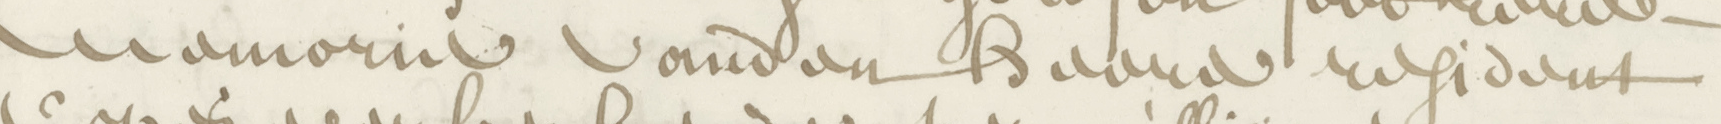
Memorie vanden heere resident
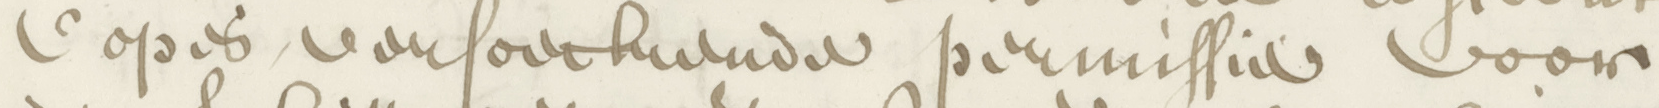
Copes, versoeckende permissie voor
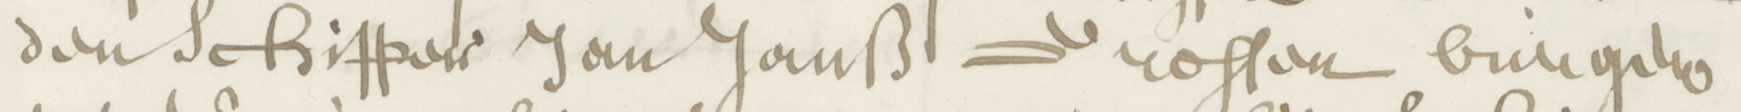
den schipper Jan Jansz Grossen burger
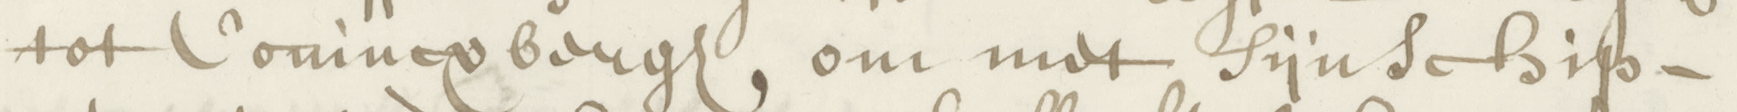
tot Conincxbergh om met sijn schip
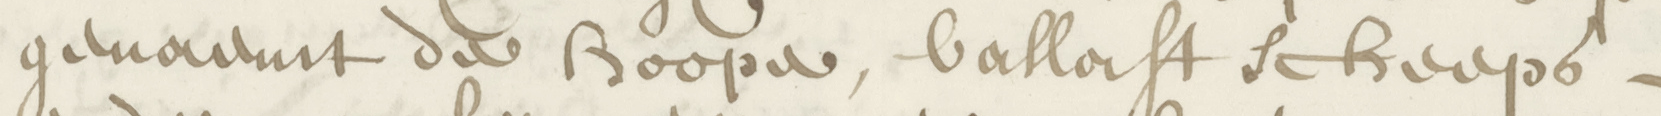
genaemt de Hoope, ballast scheeps
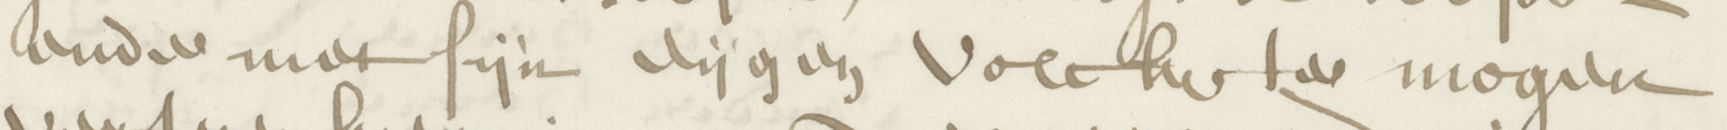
ende met sijn eijgen volck te mogen
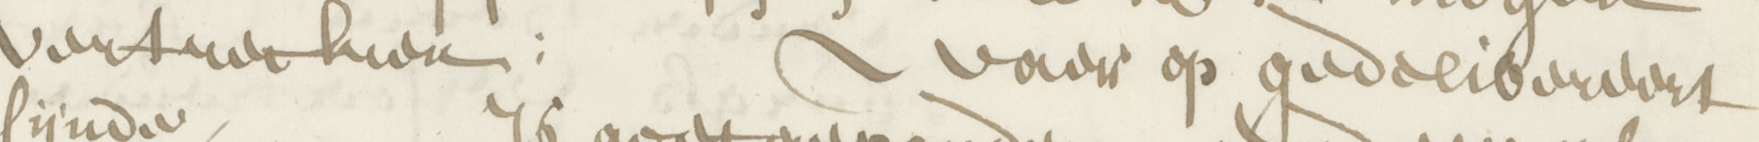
vertrecken: Waer op gedelibereert
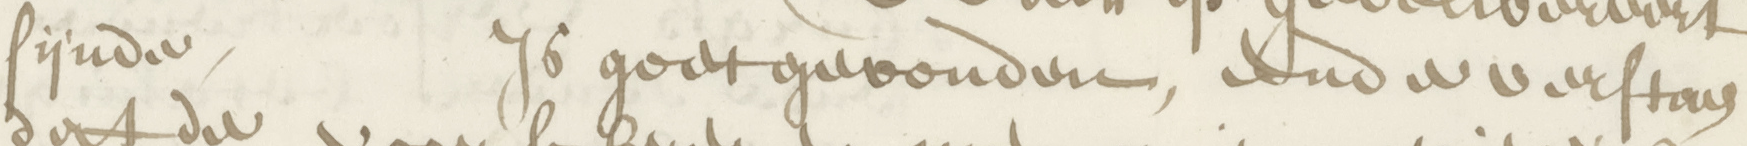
sijnde, Is goetgevonden, ende verstaen
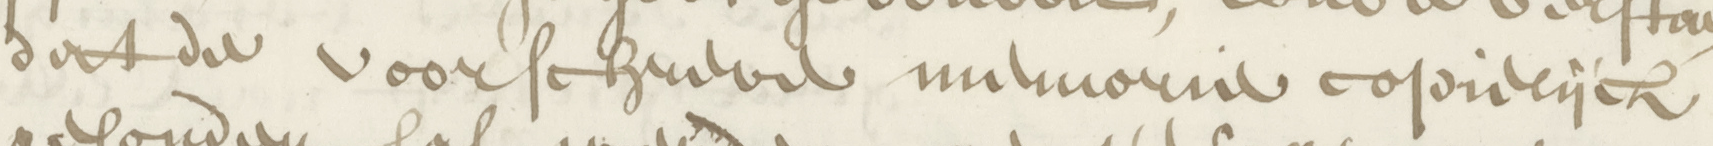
dat de voorschreve memorie copielijck
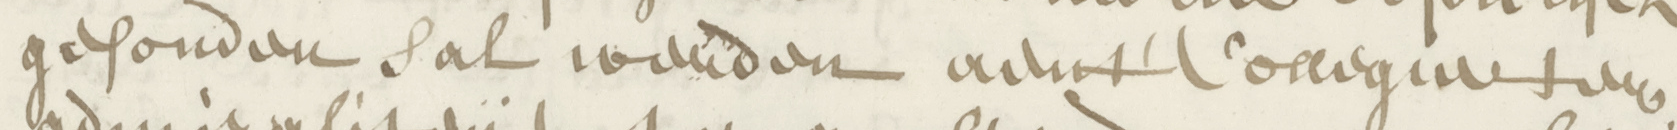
gesonden sal werden aent Collegie ter
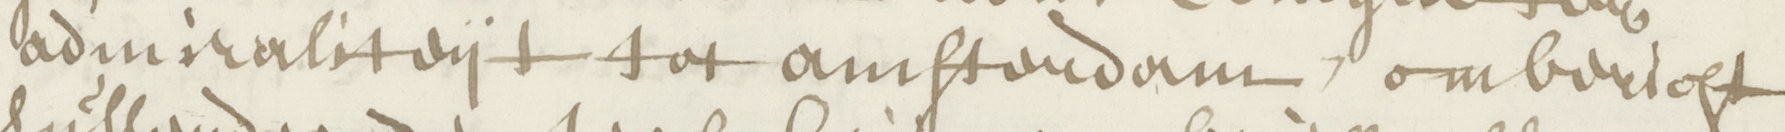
admiraliteijt tot amsterdam, om bericht
